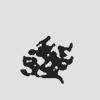𡄹
